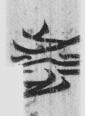涉
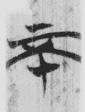不
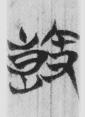鼓
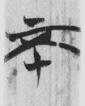不
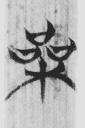喿
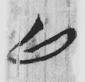㠯（以）
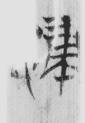{水帚}
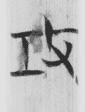攻
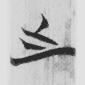之
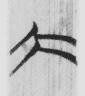大
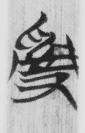𤔔
